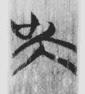吳
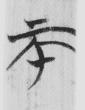帀
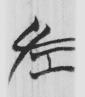左
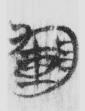軍
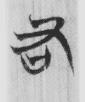右
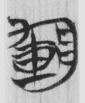軍
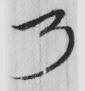乃
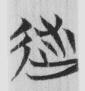述
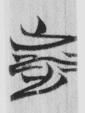涉
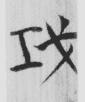{工戈}
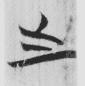之
